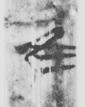隹
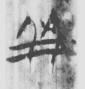并
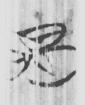是
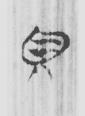{目人}
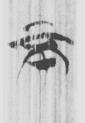不
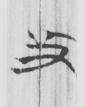及
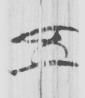五
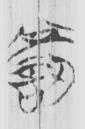罰
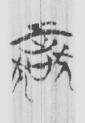獄
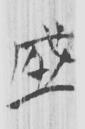城
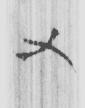又
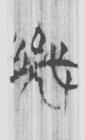幾
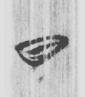日
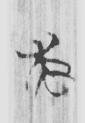求
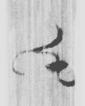氒
